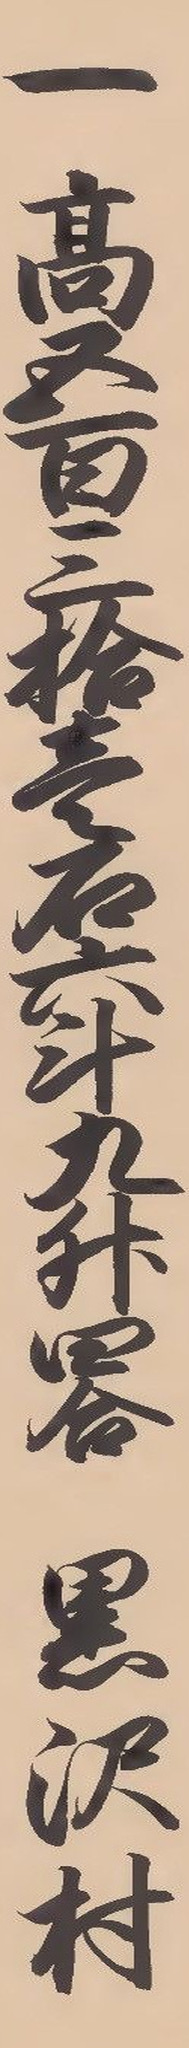一髙五百三拾壱石六斗九升四合黑沢村
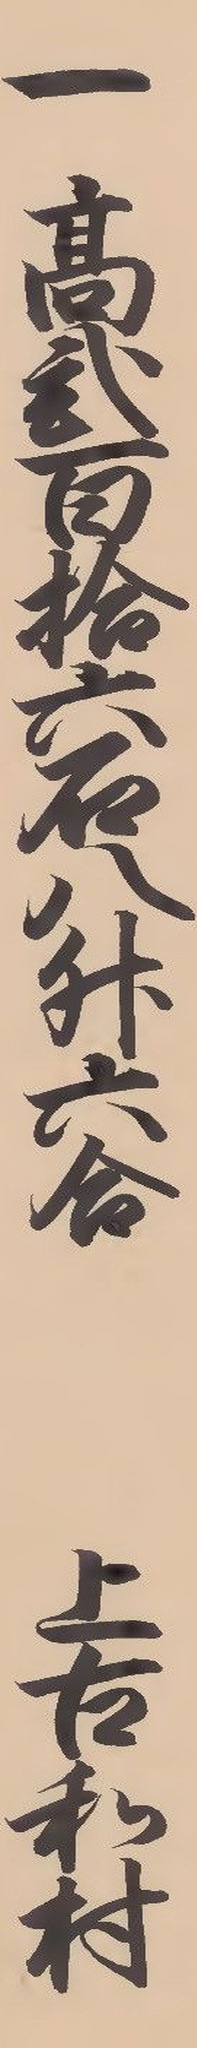一髙弐百拾六石八升六合上古和村
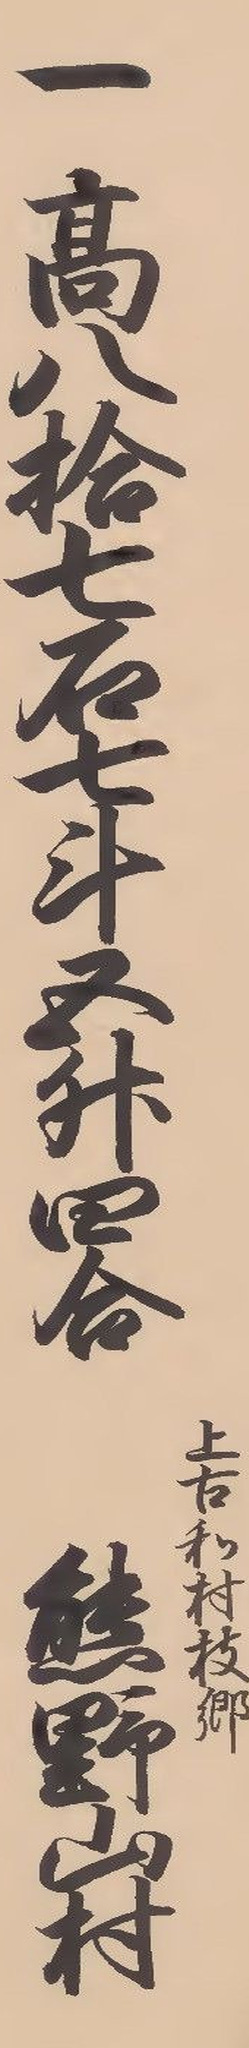一髙八拾七石七斗五升四合熊野山村
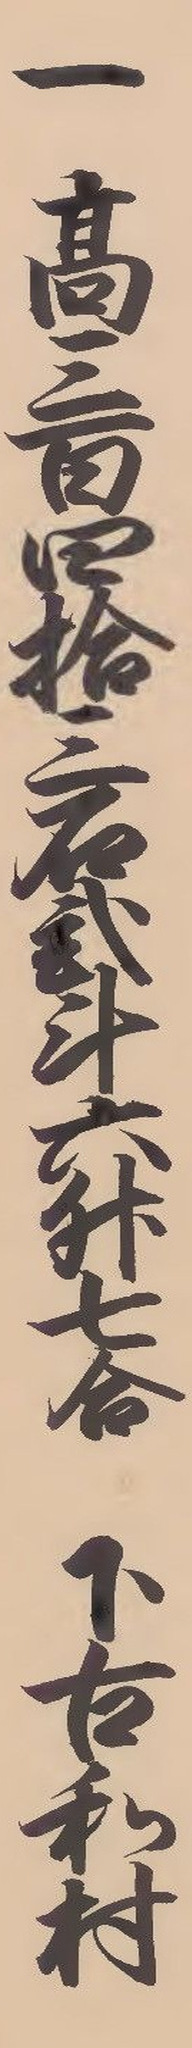一髙三百四拾三石弐斗六升七合下古和村

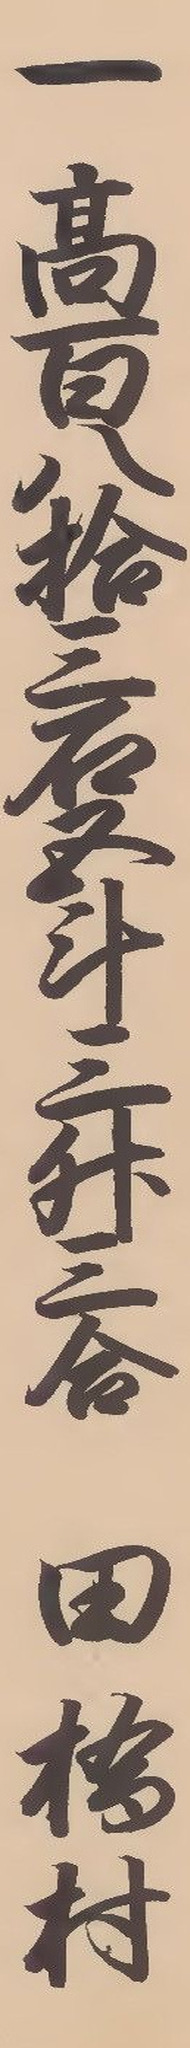一髙百八拾三石五斗三升三合田橋村
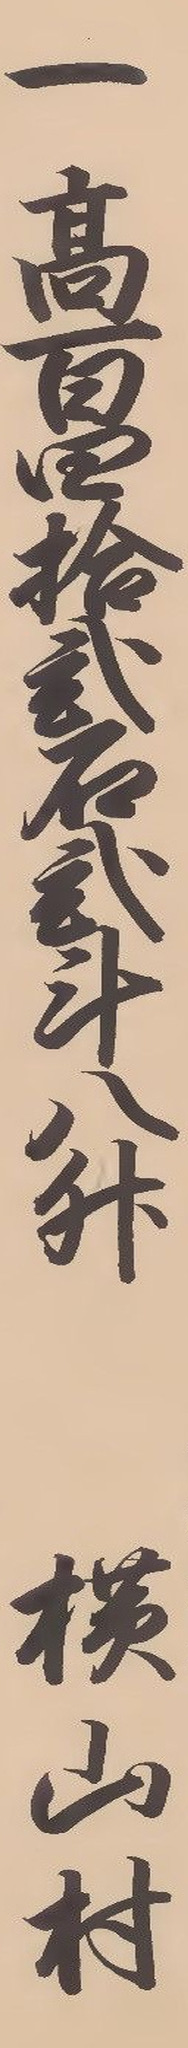一髙百四拾弐石弐斗八升横山村
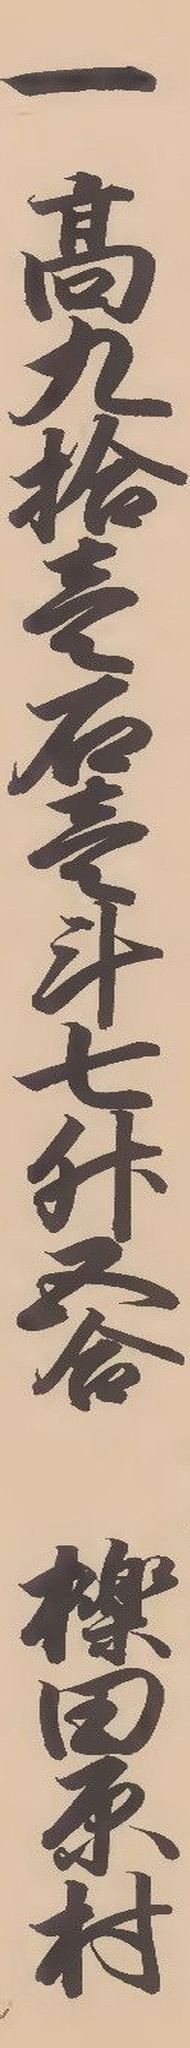一髙九拾壱石壱斗七升五合櫟田原村
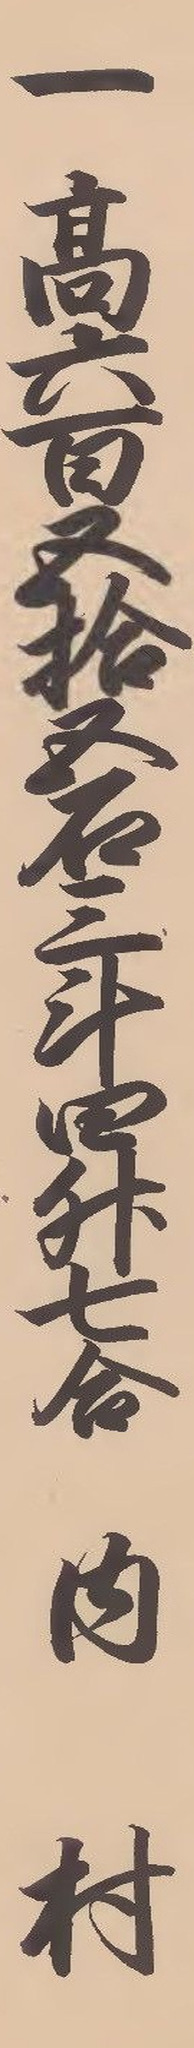一髙六百五拾五石三斗四升七合内村
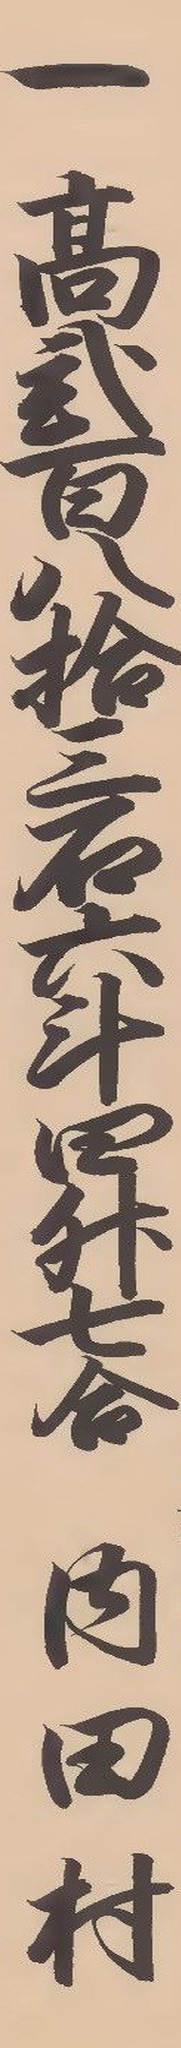一髙弐百八拾三石六斗四升七合内田村
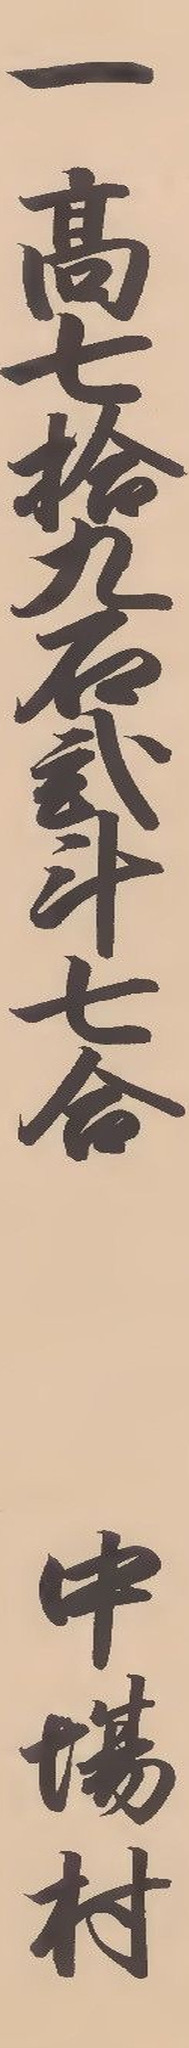一髙七拾九石弐斗七合中場村
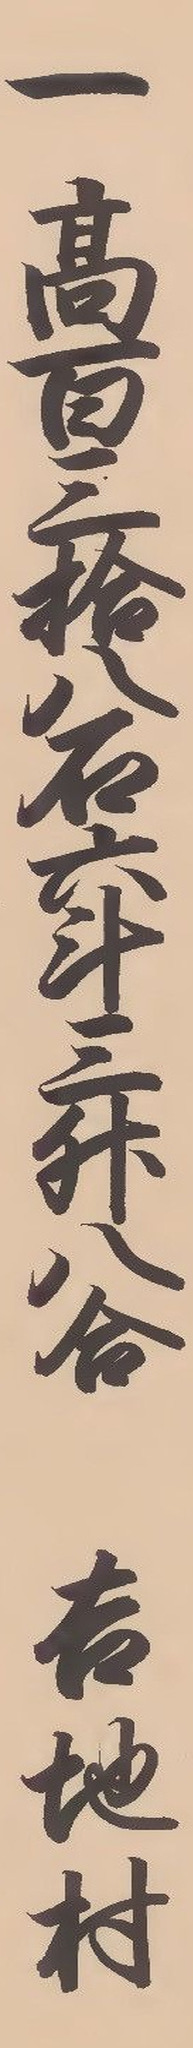一髙百三拾八石六斗三升八合吉地村
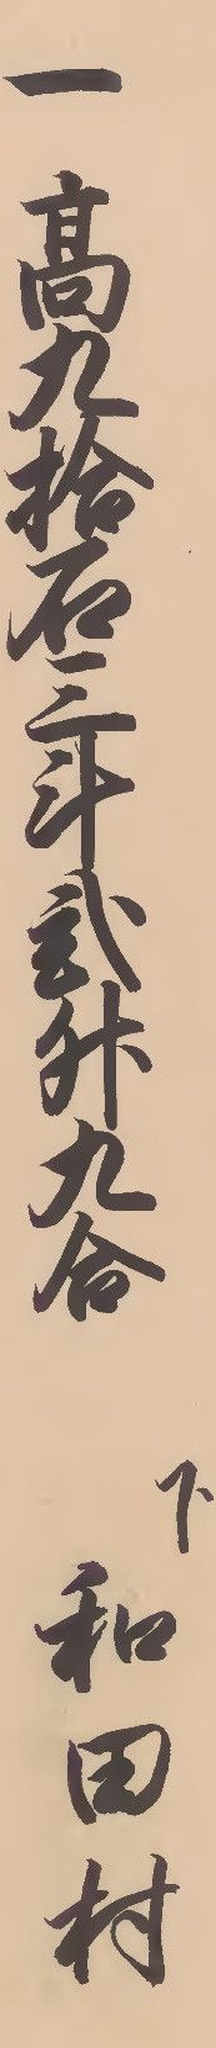一髙九拾石三斗弐升九合和田村

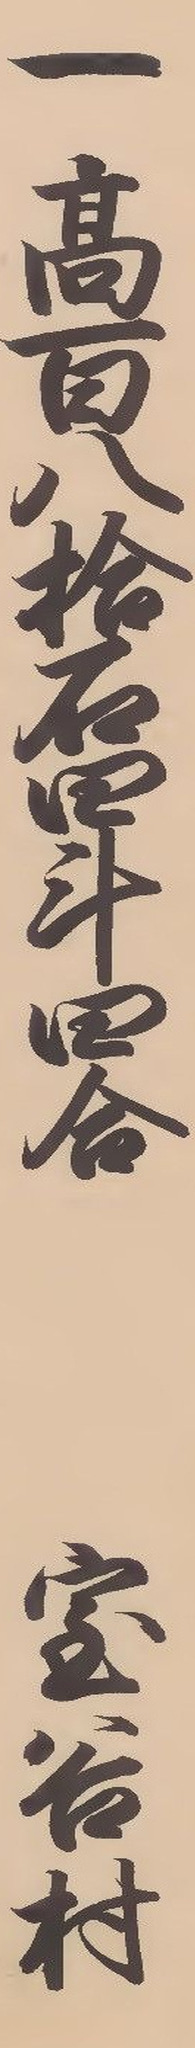一髙百八拾石四斗四合室谷村
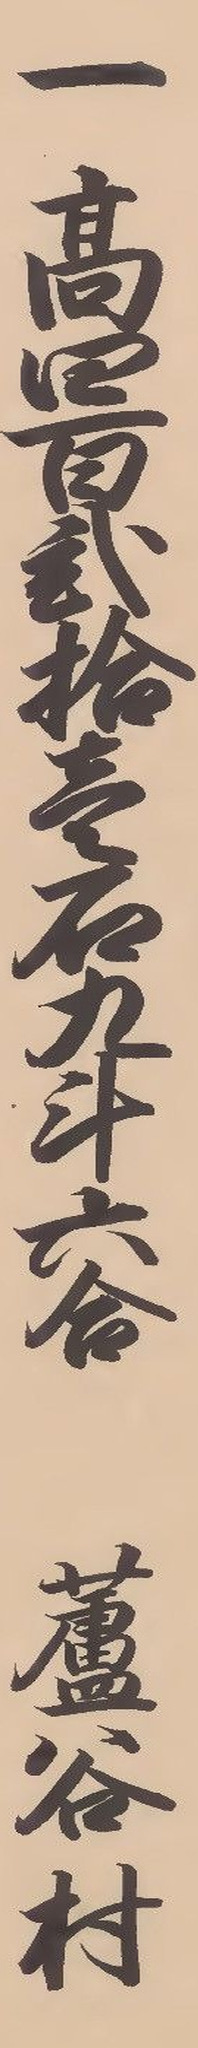一髙四百弐拾壱石九斗六合蘆谷村
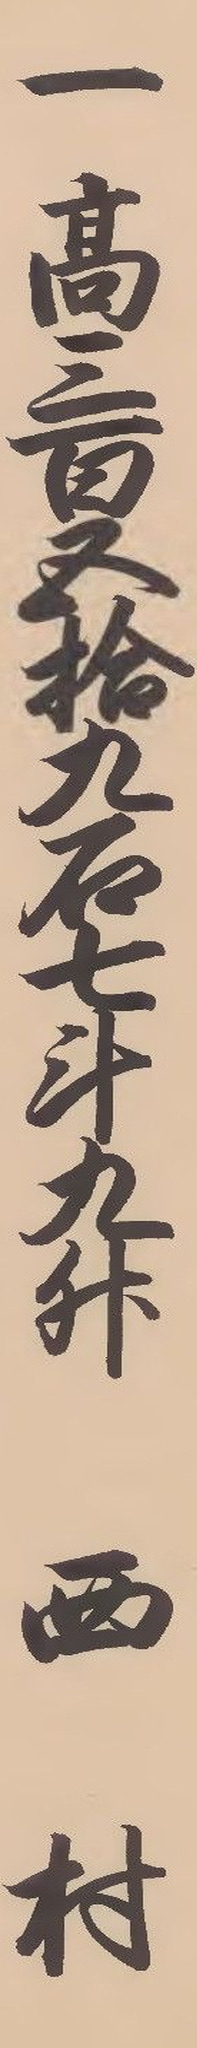一髙三百五拾九石七斗九升西村
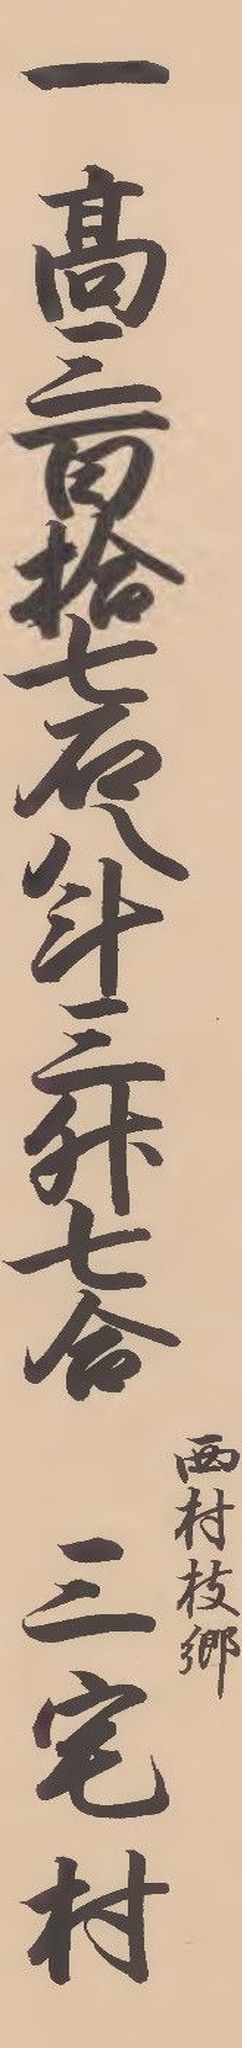一髙三百拾七石八斗三升七合三宅村
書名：石見国郷帳
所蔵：国立公文書館 National Archives of Japan
